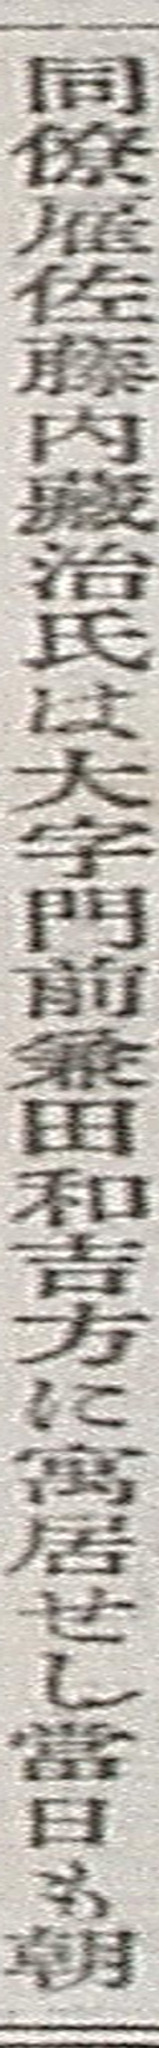同僚雇佐藤内蔵治氏は大字門前兼田和吉方に寓居せし当日も朝
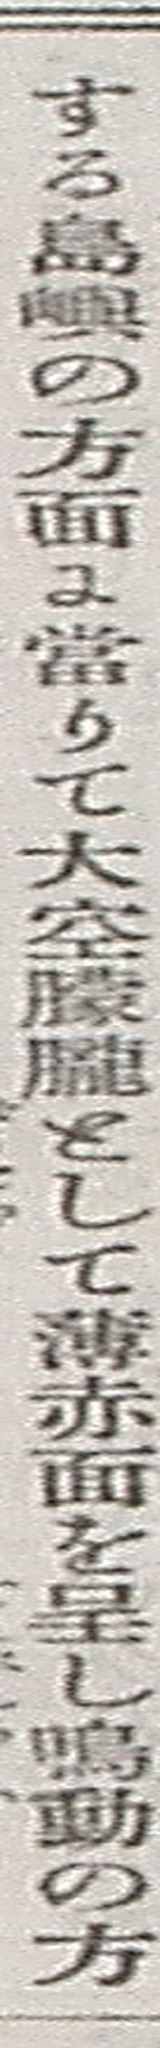する島嶼の方面に当りて大空朦朧として薄赤面を呈し鳴動の方
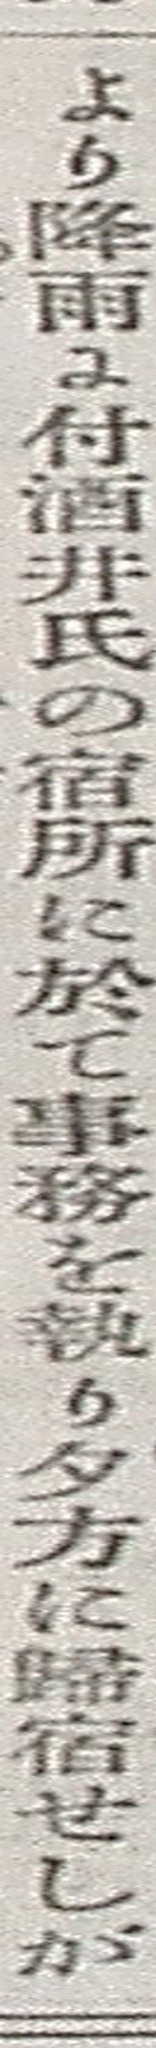より降雨に付酒井氏の宿所に於て事務を執り夕方に帰宿せしが
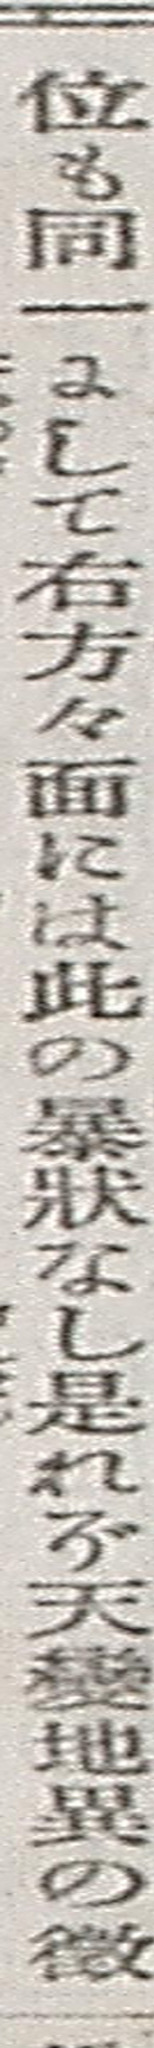位も同一にして右方々面には此の暴状なし是れぞ天変地異の徴
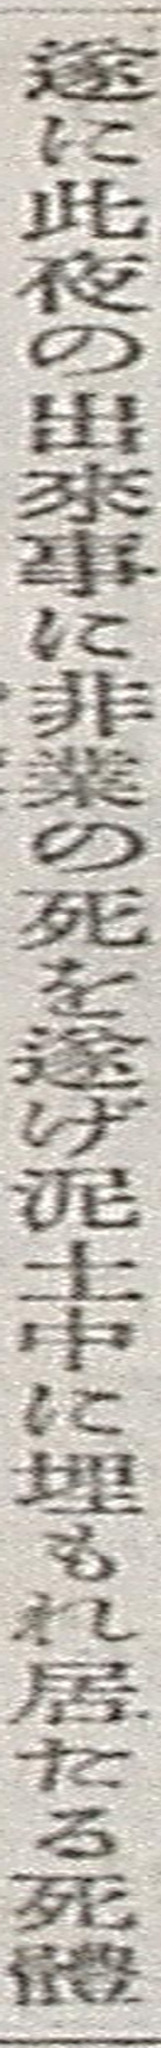遂に此夜の出来事に非業の死を遂げ泥土中に埋もれ居たる死体
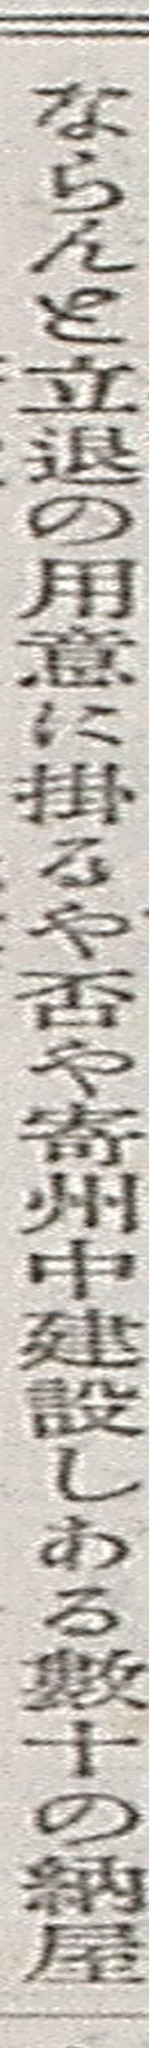ならんと立退の用意に掛るや否や寄州中建設しある数十の納屋
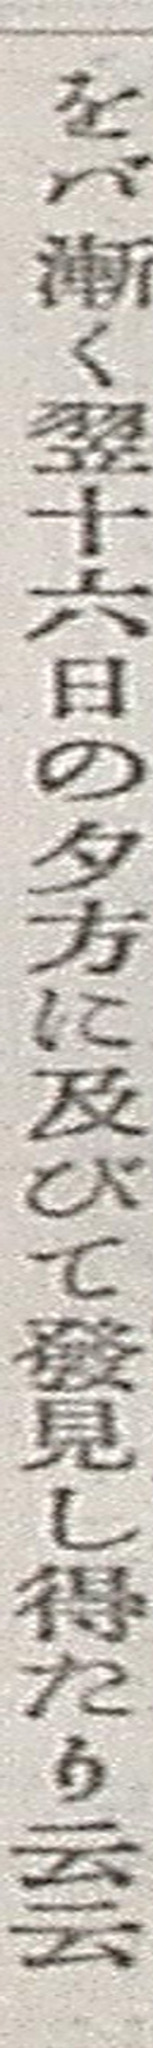をば漸く翌十六日の夕方に及びて発見し得たり云云
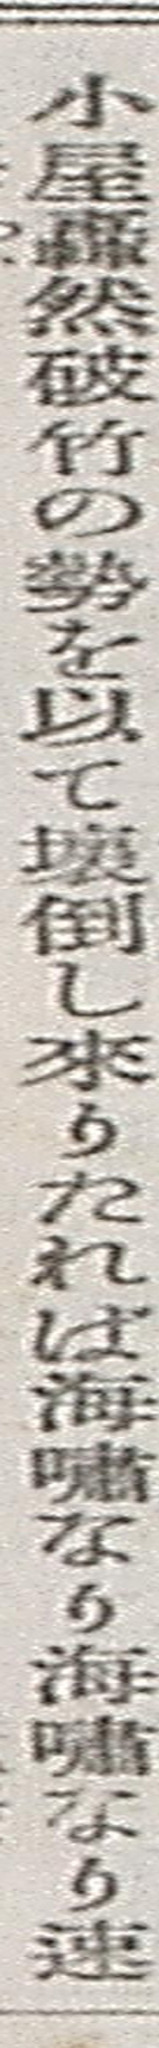小屋轟然破竹の勢を以て壊倒し来りたれば海嘯なり海嘯なり速
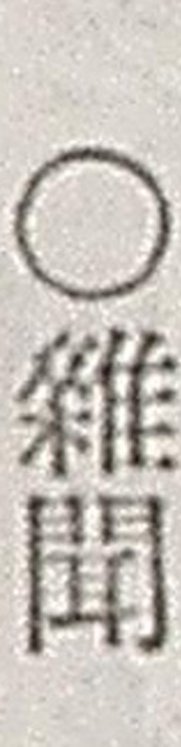○雑聞
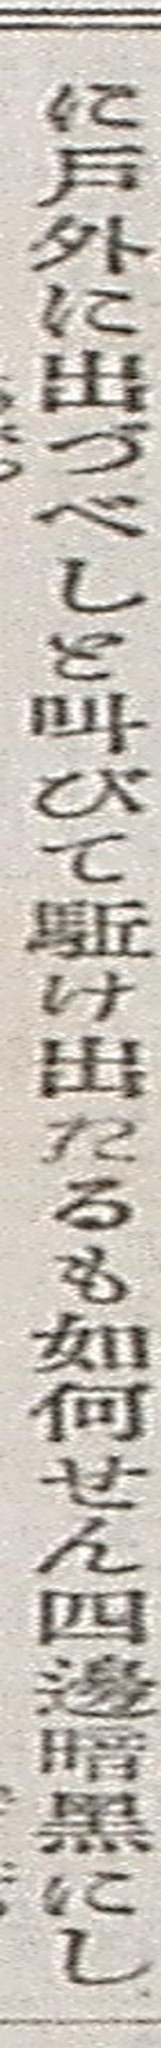に戸外に出づべしと叫びて駈け出たるも如何せん四辺暗黒にし
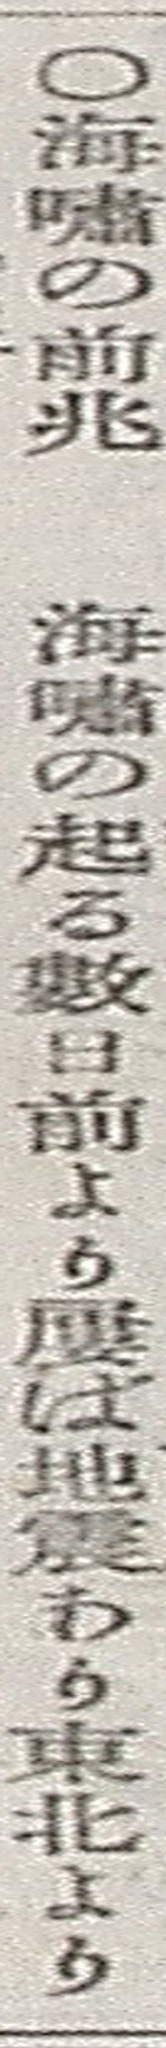○海嘯の前兆海嘯の起る数日前より屡ば地震あり東北より
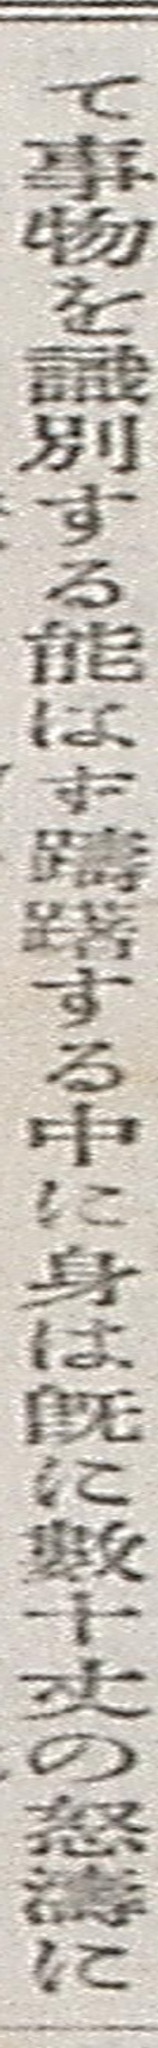て事物を識別する能はず躊躇する中に身は既に数十丈の怒濤に
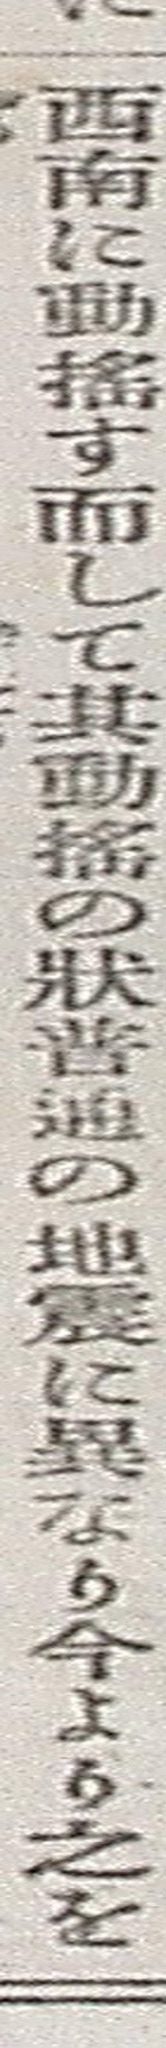西南に動揺す而して其動揺の状普通の地震に異なり今より之を
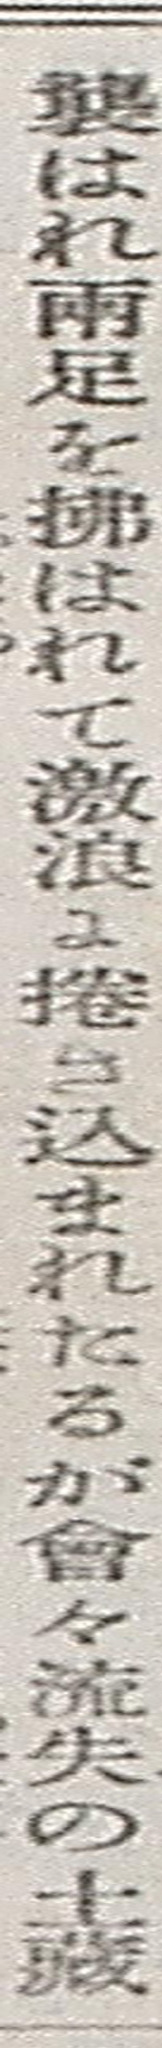襲はれ両足を払はれて激浪に捲き込まれたるが会々流失の土蔵
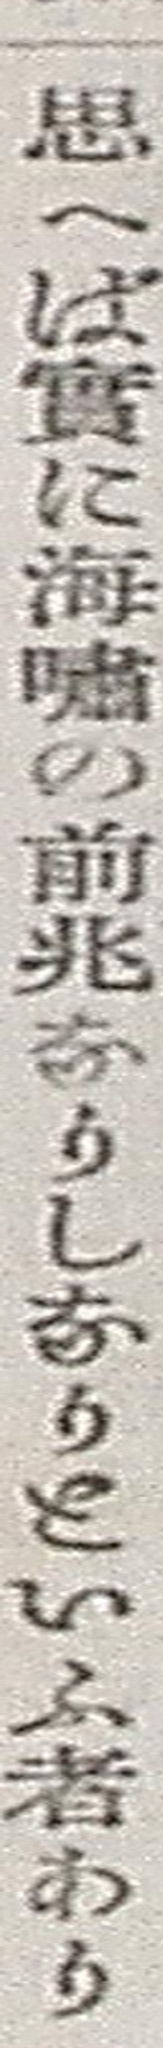思へば実に海嘯の前兆なりしなりといふ者あり
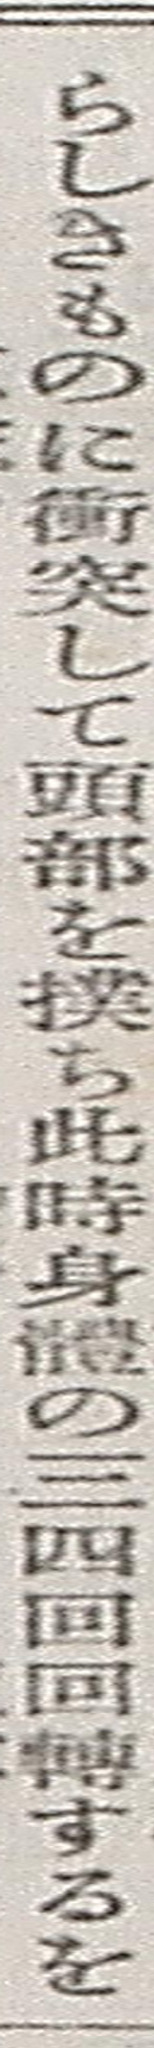らしきものに衝突して頭部を撲ち此時身体の三四回転するを
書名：風俗畫報臨時増刊第百二十號　大海嘯被害録（下）
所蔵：東京大学地震研究所図書室 Earthquake Research Institute Library, The University of Tokyo, JAPAN
